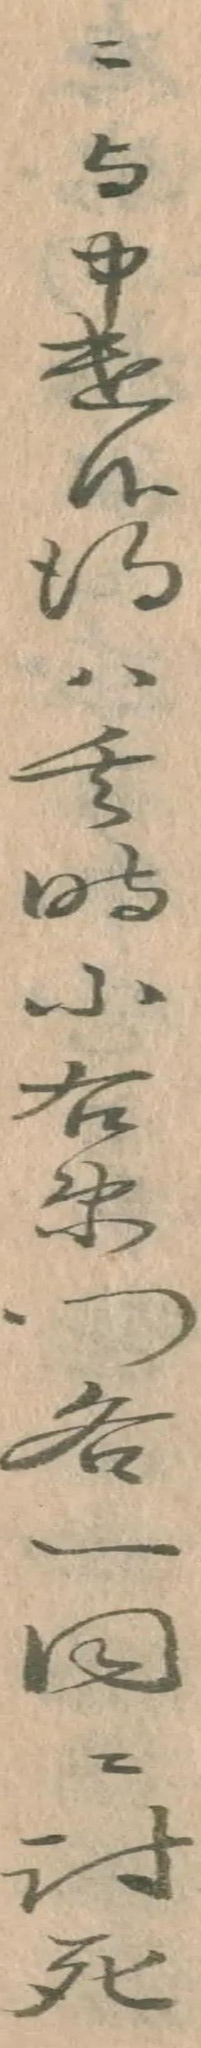に与申遣候得は其時小右衛門各一同に討死
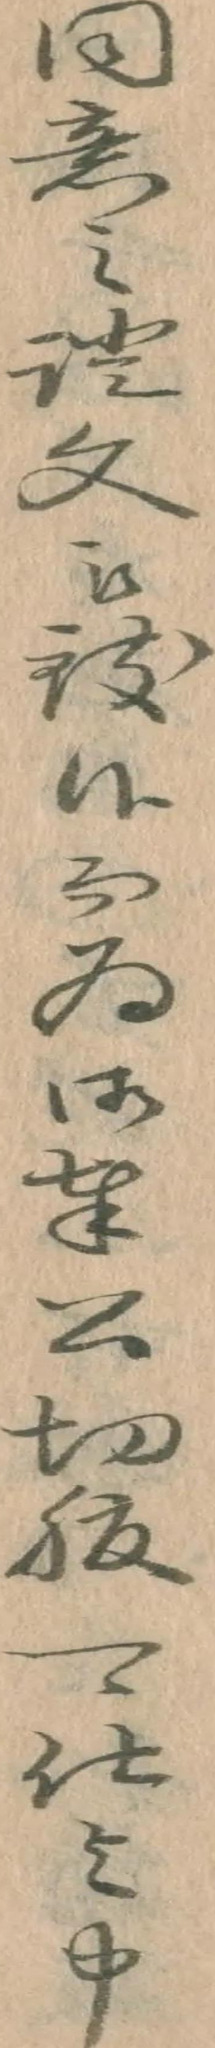同意之証文被致候而ゐ御奉公切腹可仕与申
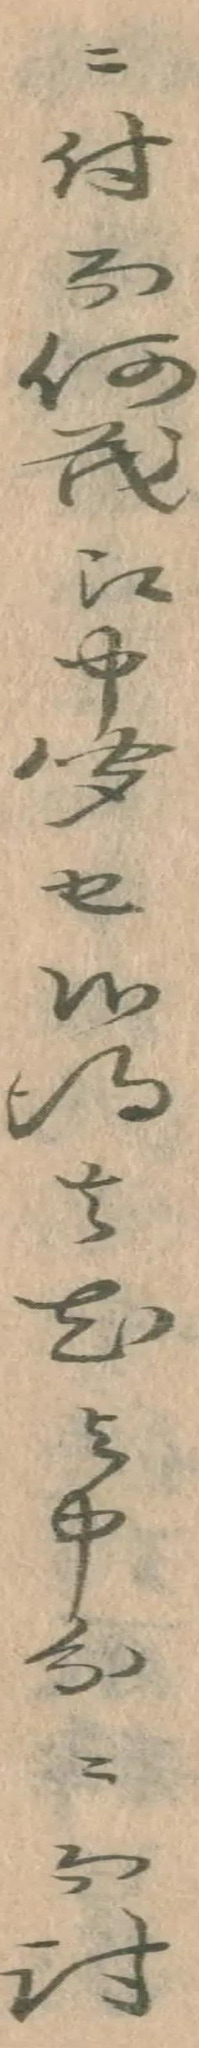に付而何茂江申聞せ候得者尤与申分に而討
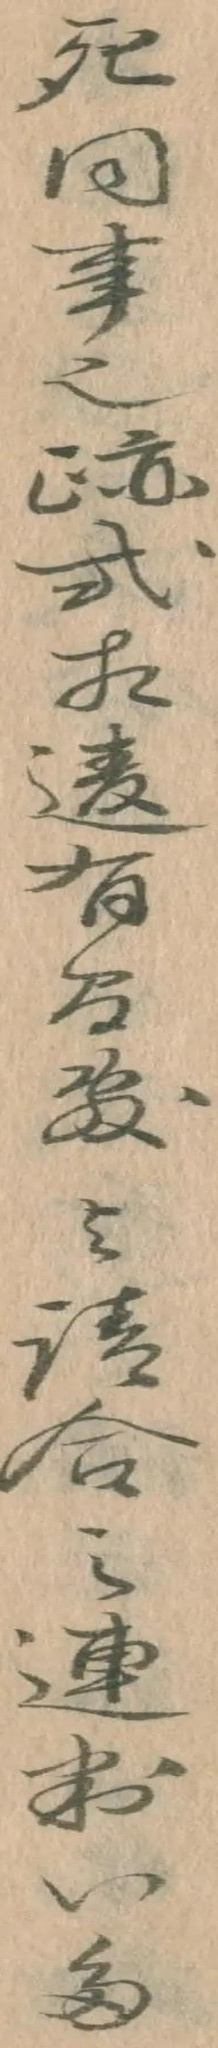死同事也跡式相違有間敷与請合之連判い多
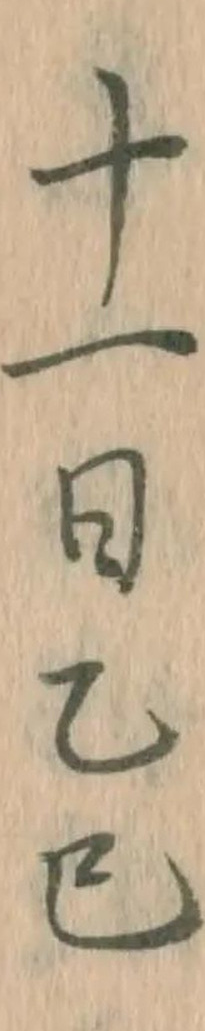十一日乙巳
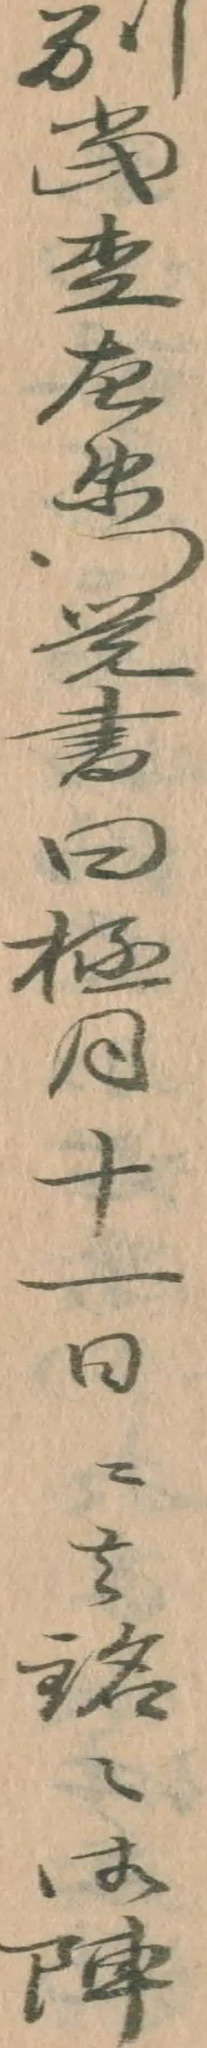別当杢左衛門覚書曰極月十一日に者銘々御陣
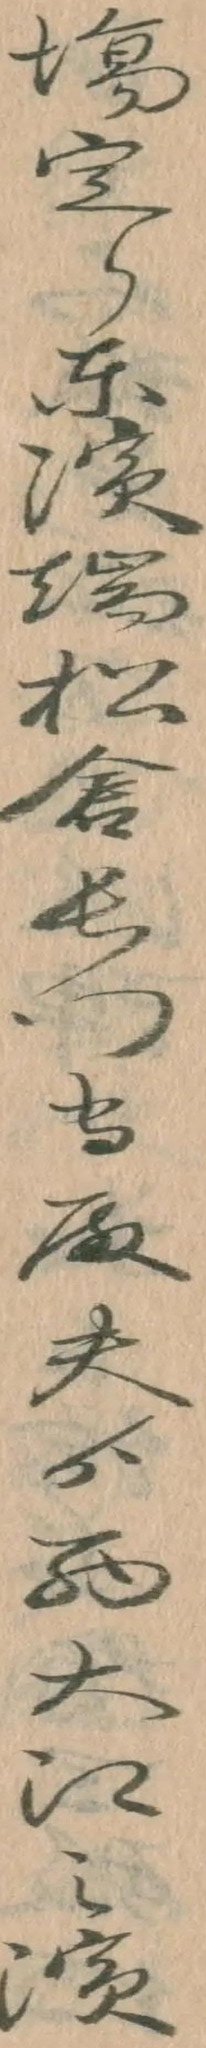場定り東浜端松倉長門守殿夫ゟ西大江之浜
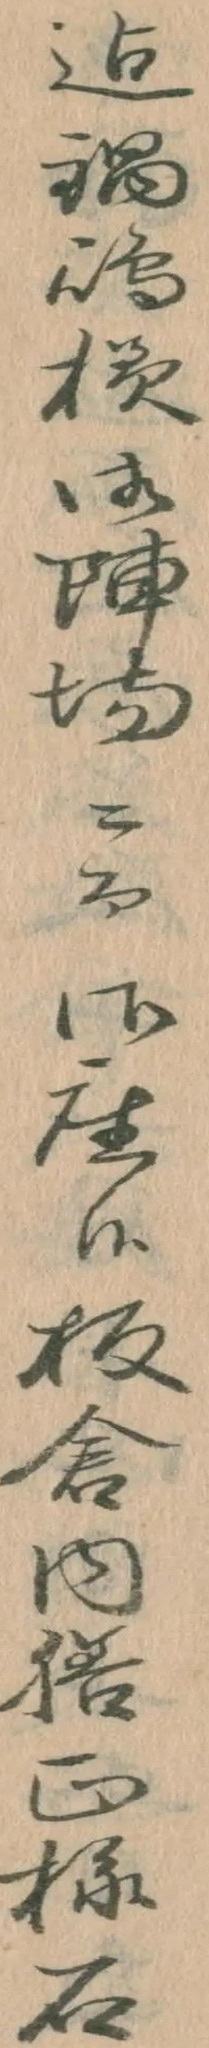迄鍋島様御陣場に而御座候板倉内膳正様石
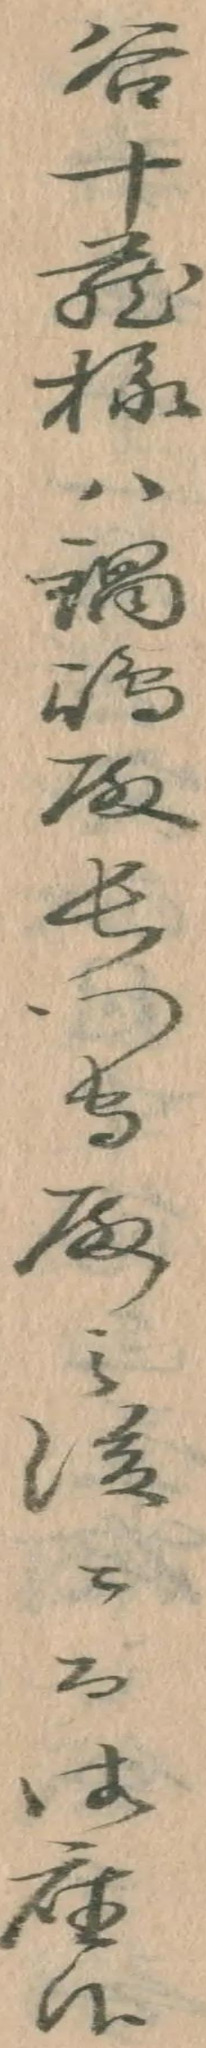谷十蔵様は鍋島殿長門守殿之後に而御座候
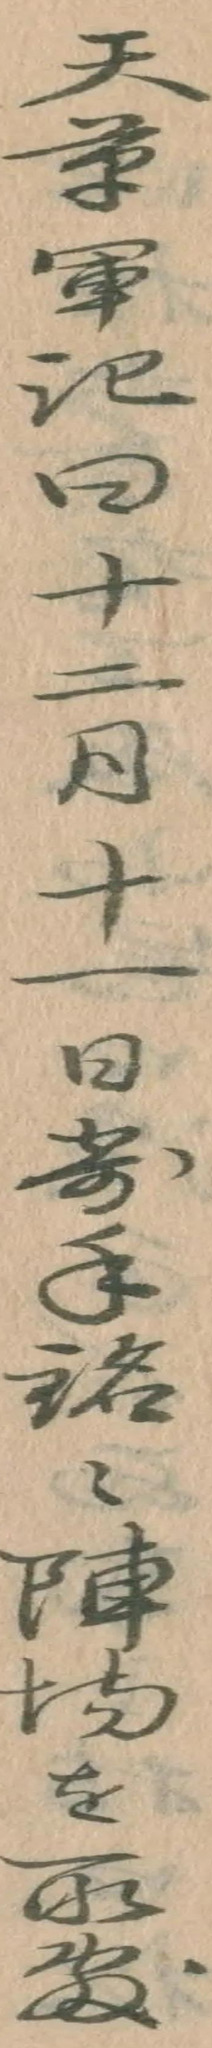天草軍記曰十二月十一日寄手銘々陣場を取敷
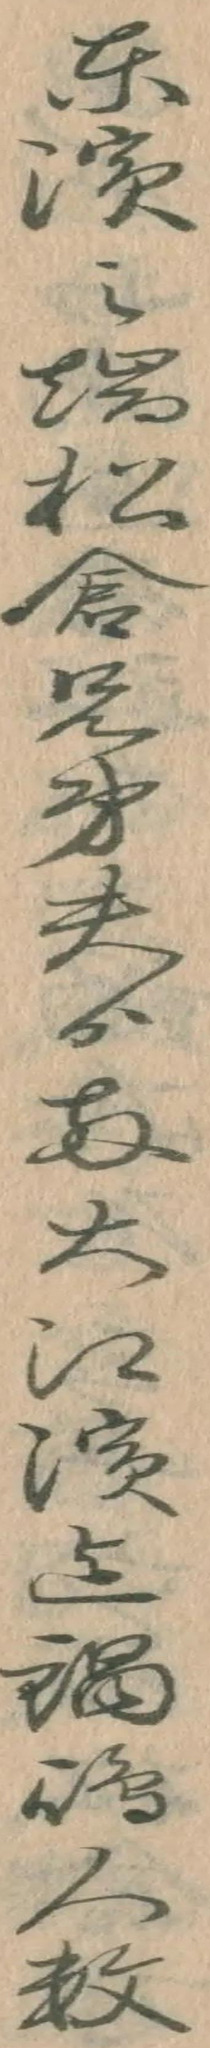東浜之端松倉兄弟夫ゟ両大江浜迄鍋島人数
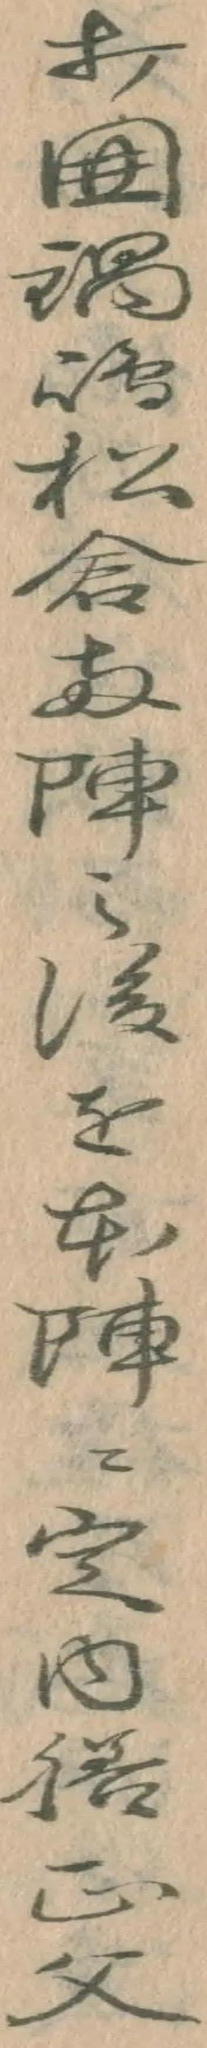打囲鍋島松倉両陣之後を本陣に定内膳正父
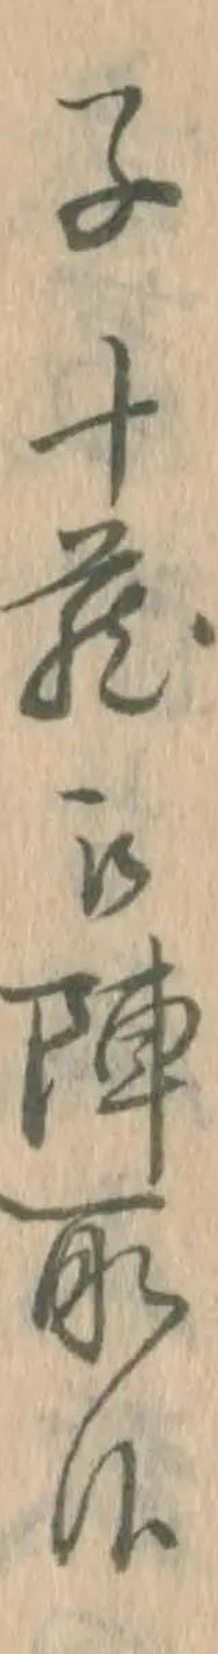子十蔵被陣取候
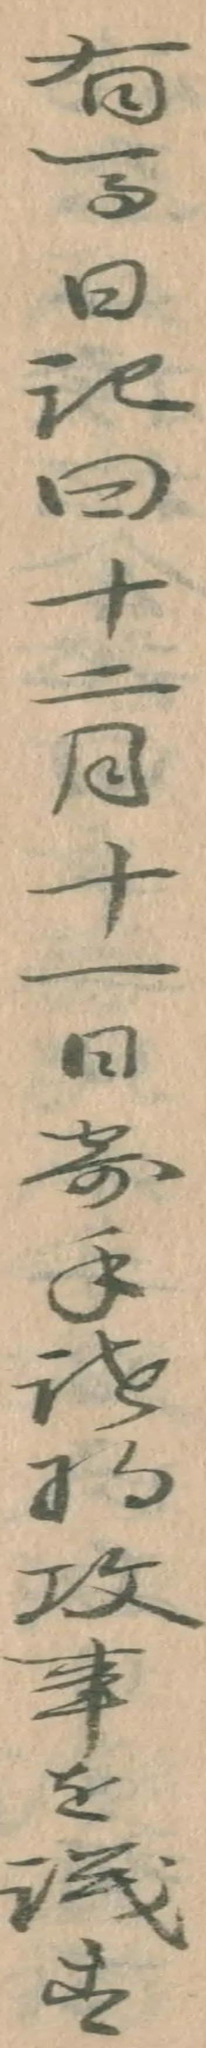有馬日記曰十二月十一日寄手諸将攻事を議春
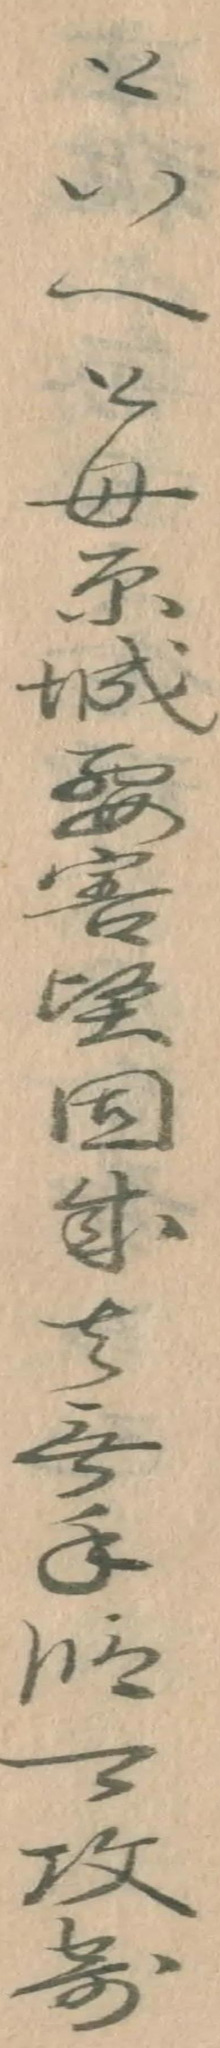といへと母原城要害堅固成者無手段可攻寄

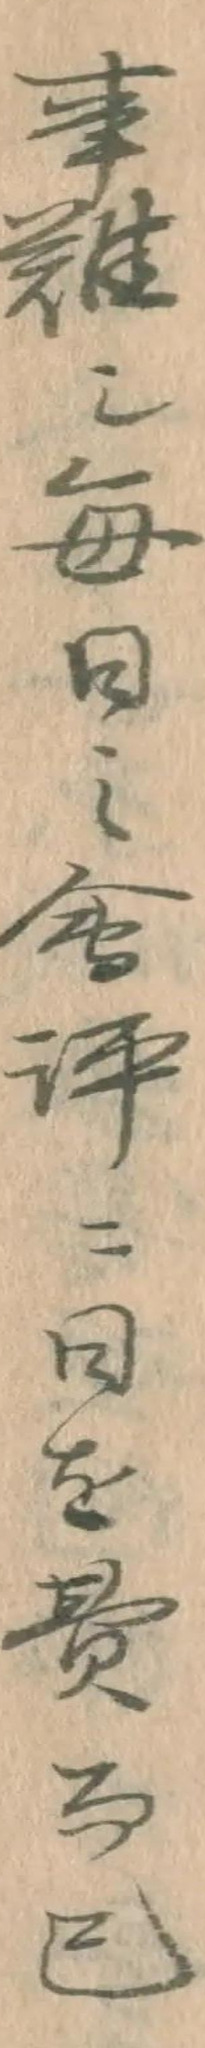事難し毎日之会評に日を費而巳
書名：切支丹御退治記 49巻. [4]
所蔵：国立国会図書館 National Diet Library, JAPAN
